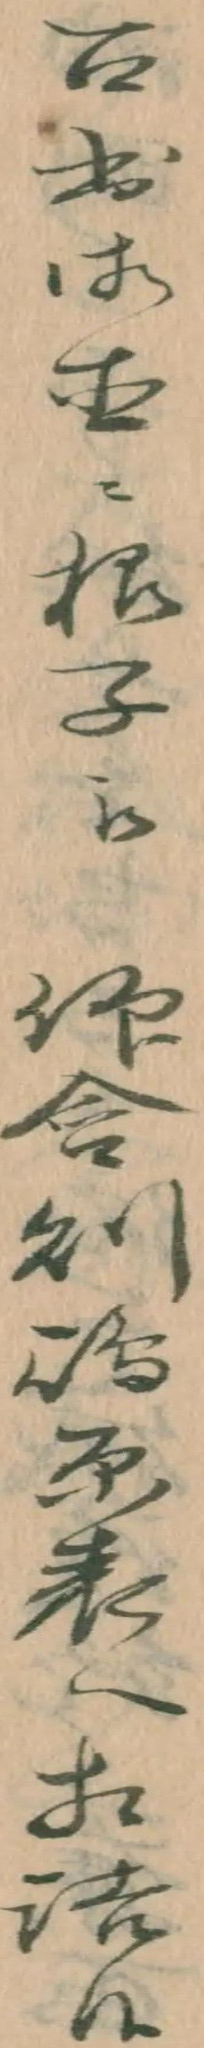召出御直に様子被仰合則島原表へ相詰候
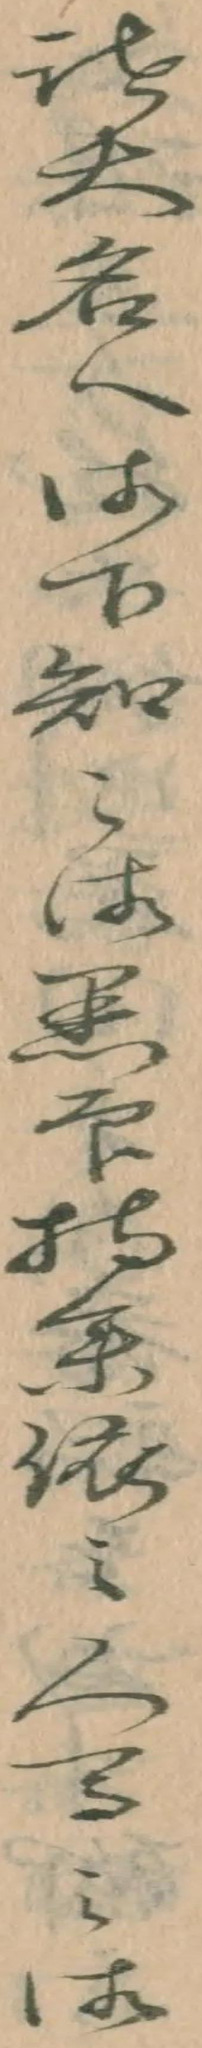諸大名へ御下知之御黒印持参依之人馬之御
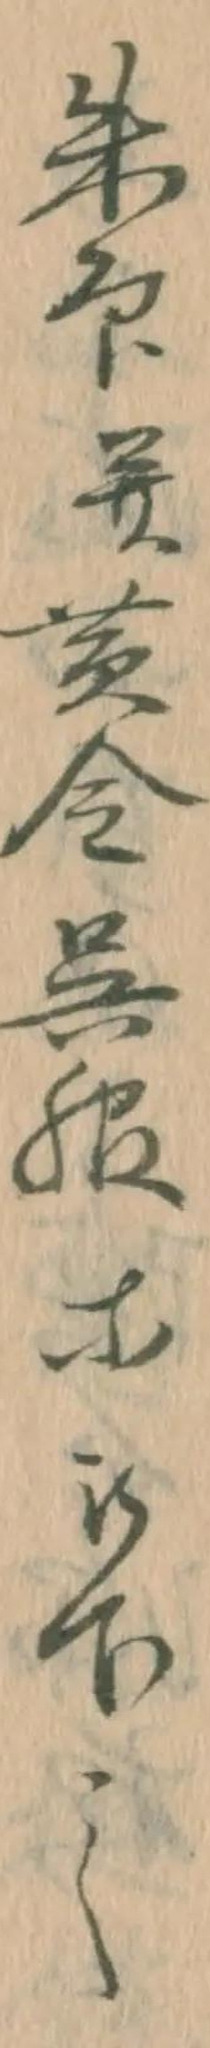朱印幷貰令呉服等被下之
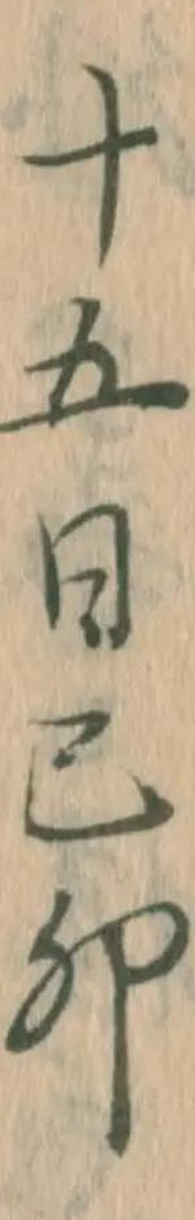十五日乙夘
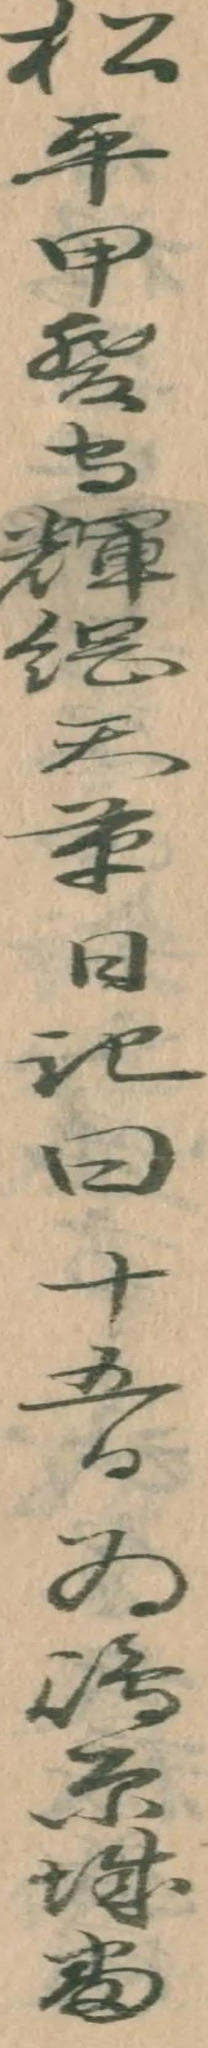松平甲斐守輝綱天草日記曰十五日ゐ島原城番
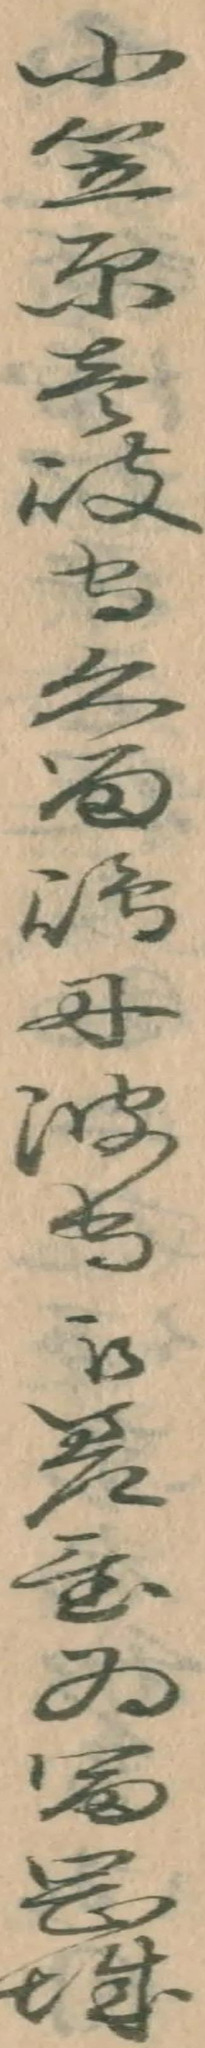小笠原壱岐守久留島丹波守被差置ゐ冨岡城
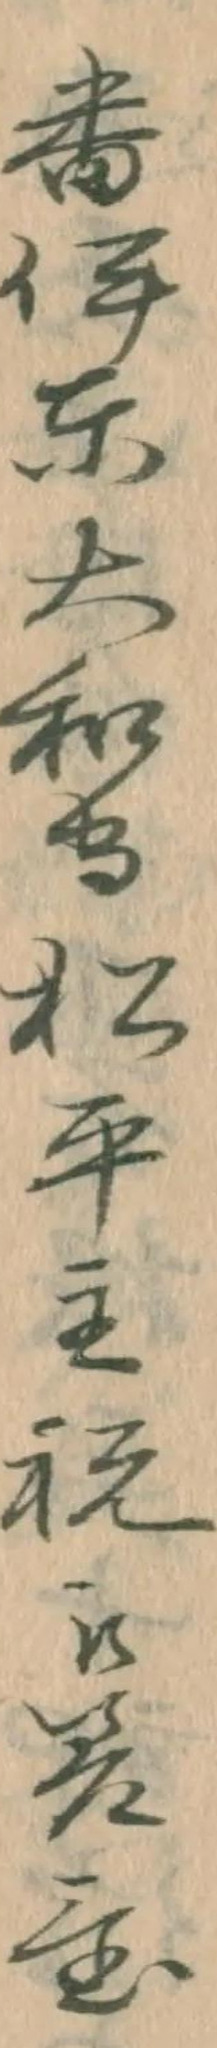番伊東大和守松平主税被差置
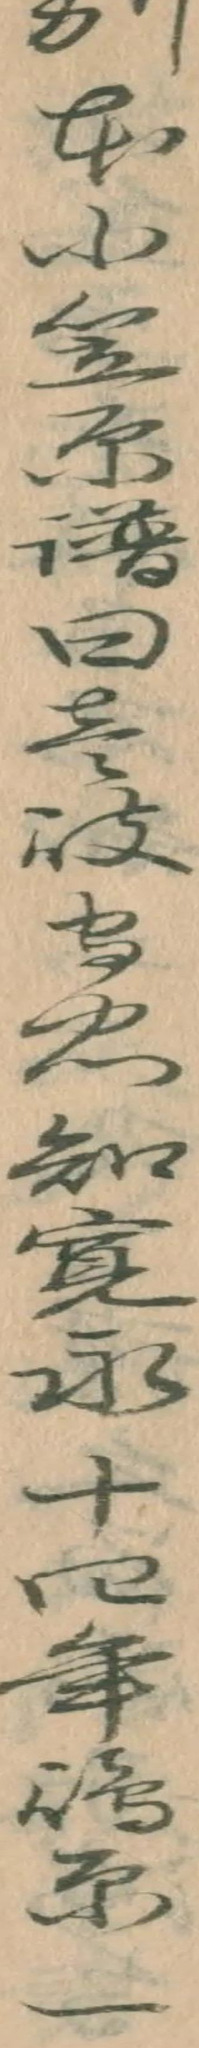別本小笠原譜曰壱岐守忠知寛永十四年島原一
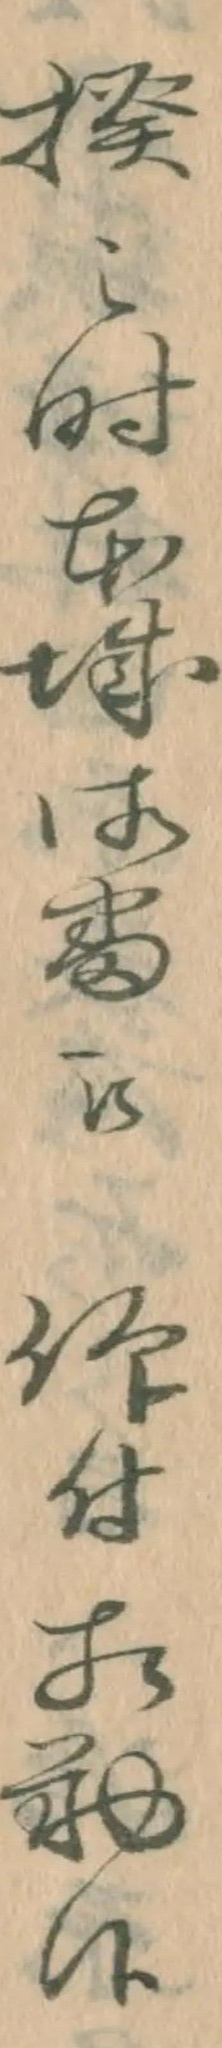揆之時本城御番被仰付相勤候

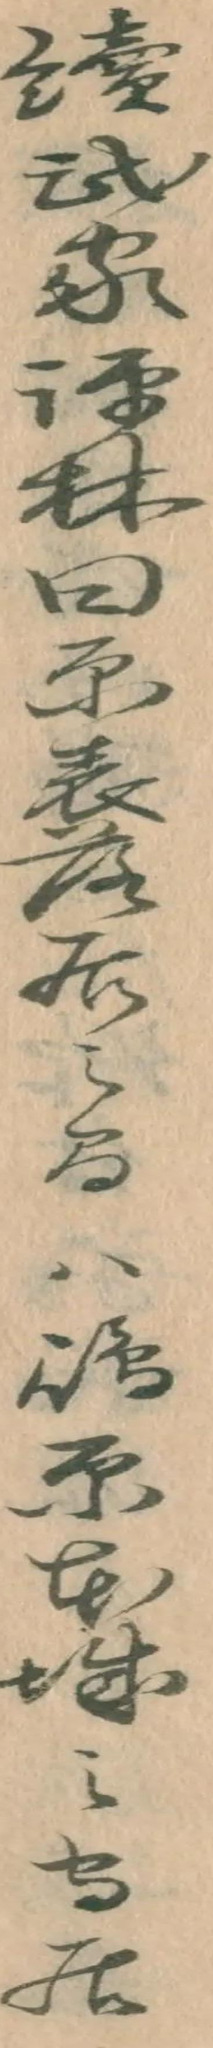続武家評林曰原表落居之間は島原本城之守居
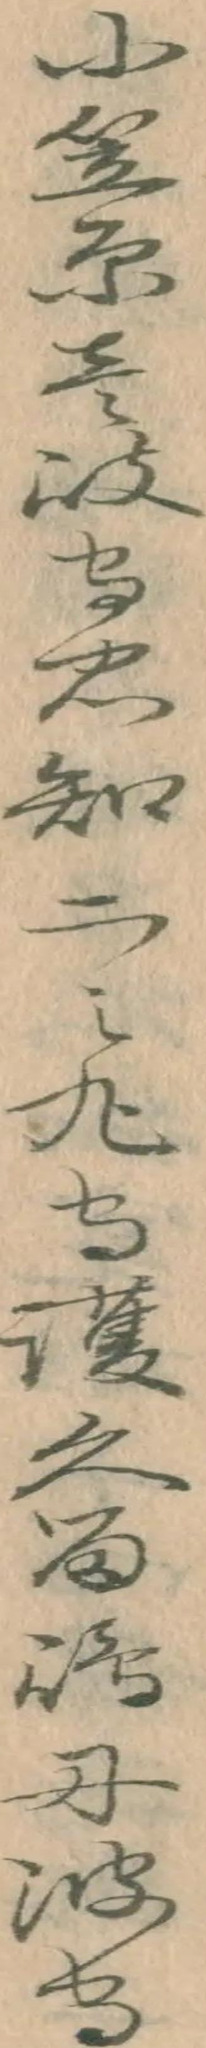小笠原壱岐守忠知二之丸守護久留島丹波守
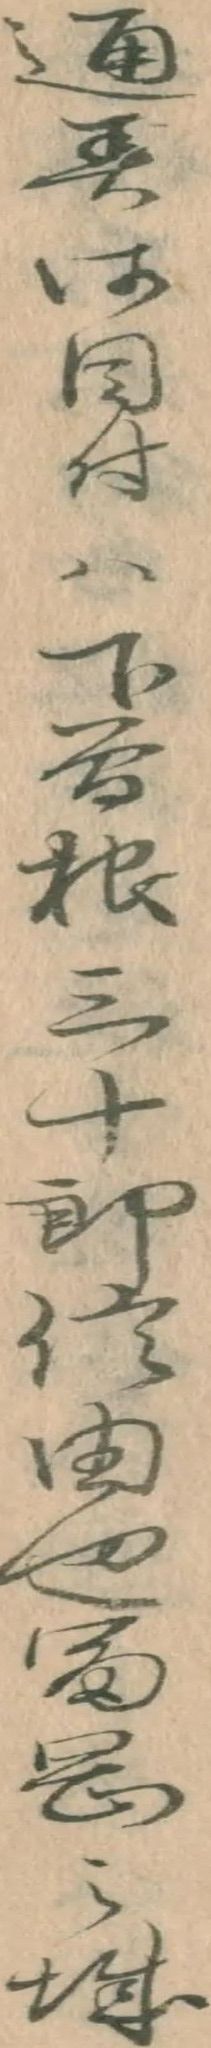通美御目付は下曽根三十郎信由也冨岡之城
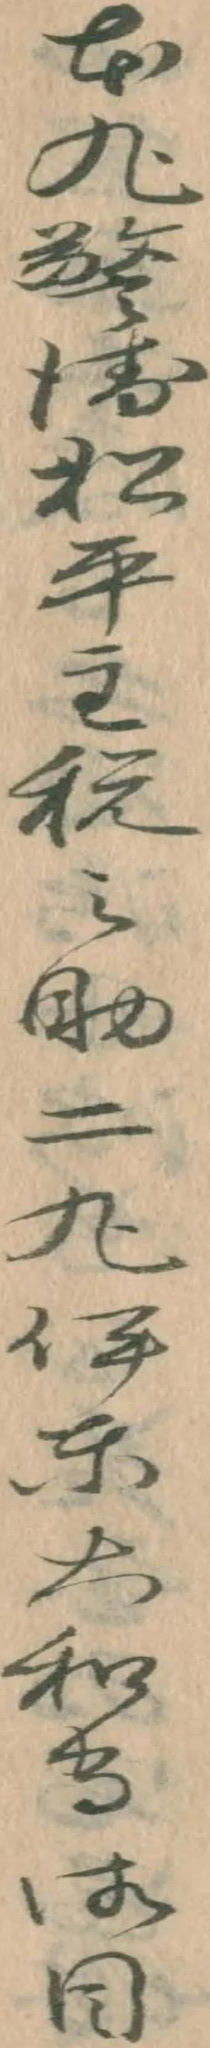本丸警衛松平主税之助二丸伊東大和守御目
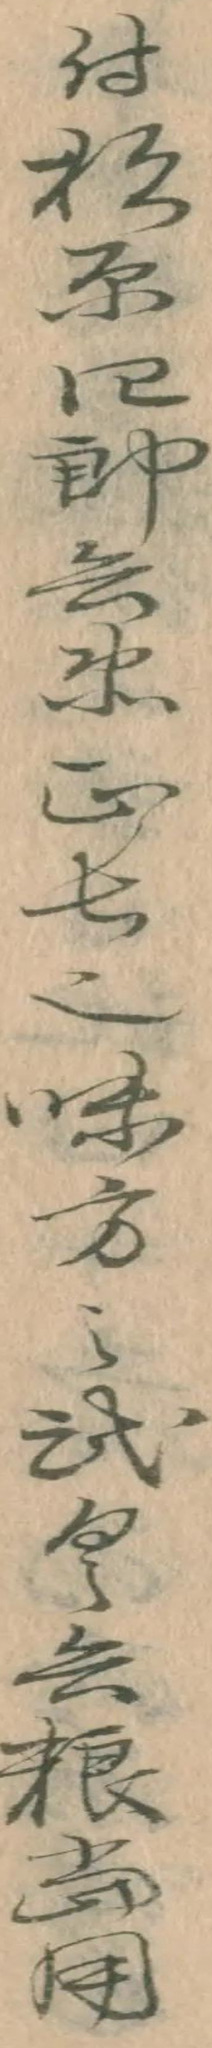付杉原四郎兵衛正長也味方之武具兵粮当用
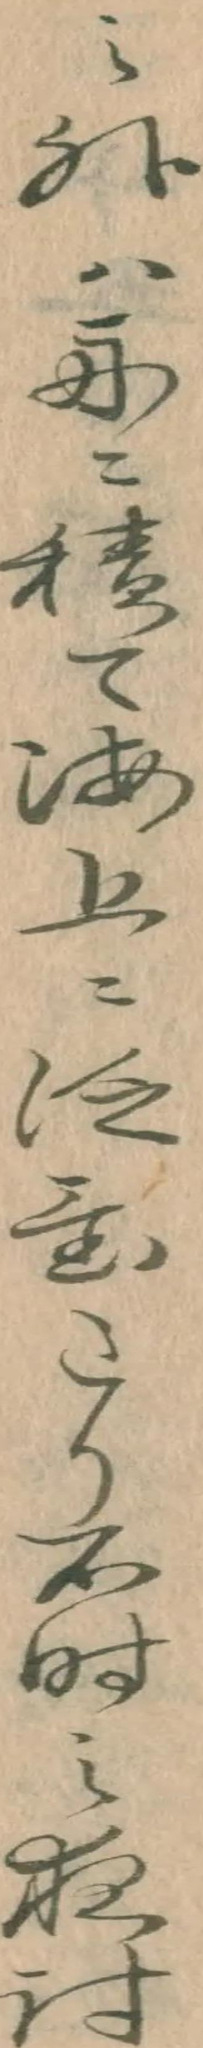之外は舟に積て海上に浮置たり不時之夜討
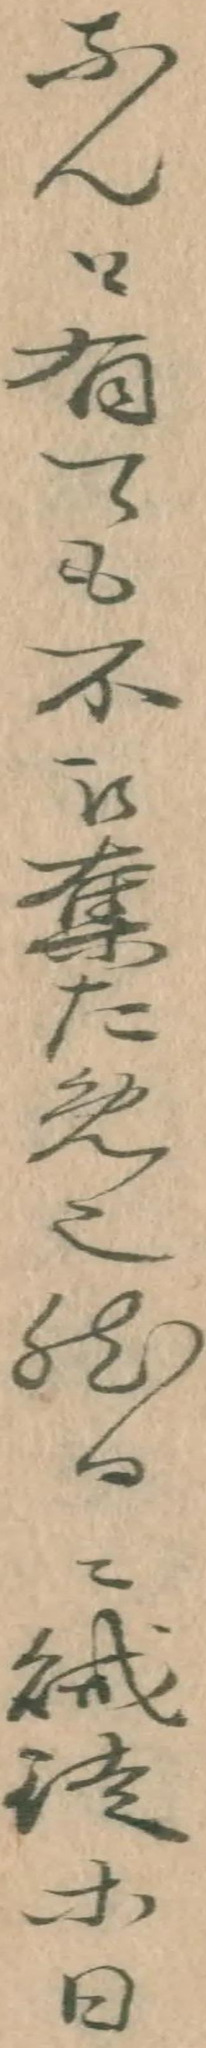なんと有ても不被奪た免也然るに賊徒等日
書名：切支丹御退治記 49巻. [6]
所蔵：国立国会図書館 National Diet Library, JAPAN
